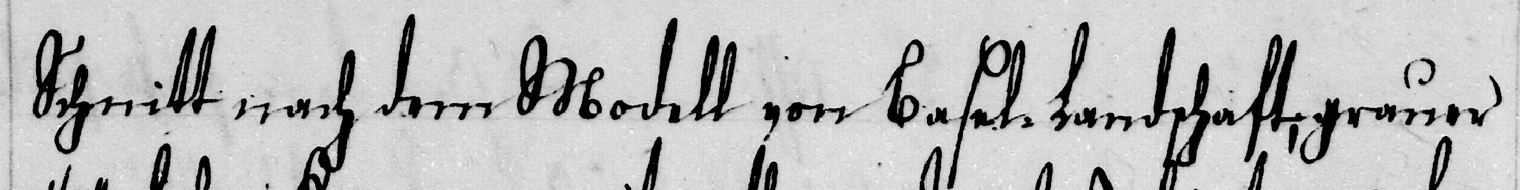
Schnitt nach dem Modell von Basel-Landschaft; grauer
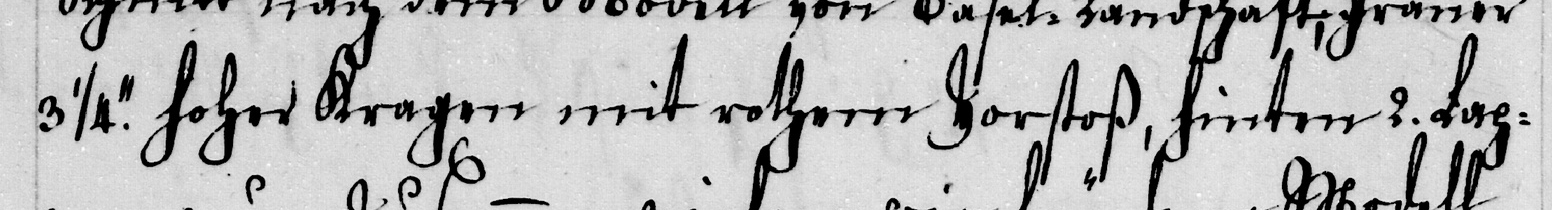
3 ¼“. hoher Kragen mit rothem Vorstoß, hinten 2. Lap¬
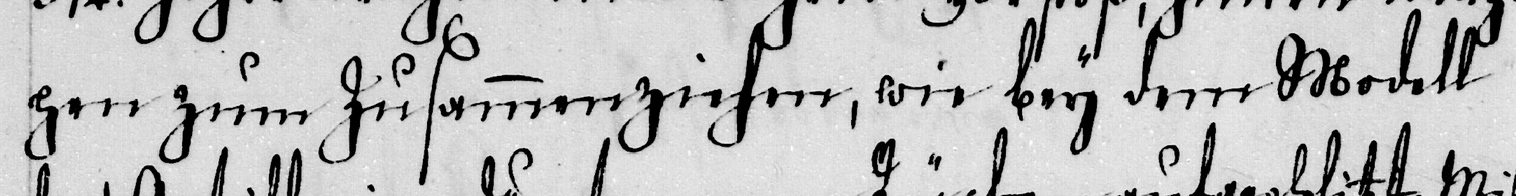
pen zum Zusammenziehen, wie bey dem Modell
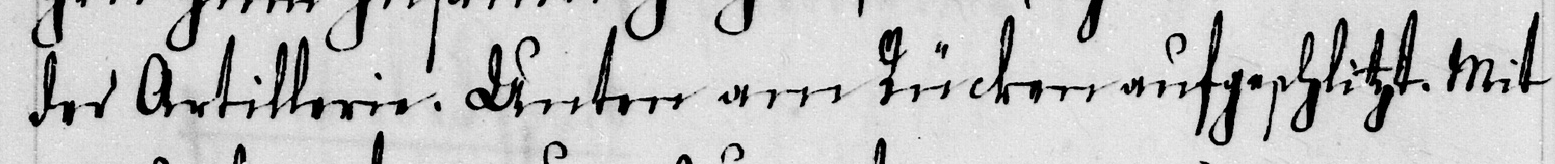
der Artillerie. Unten am Rücken aufgeschlitzt. Mit
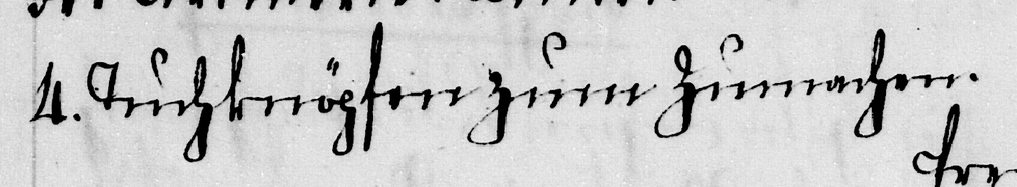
4. Tuchknöpfen zum Zumachen.
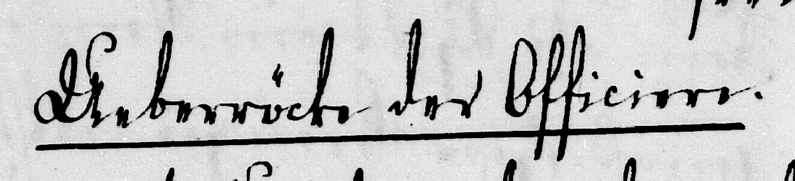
Ueberröcke der Officiere.
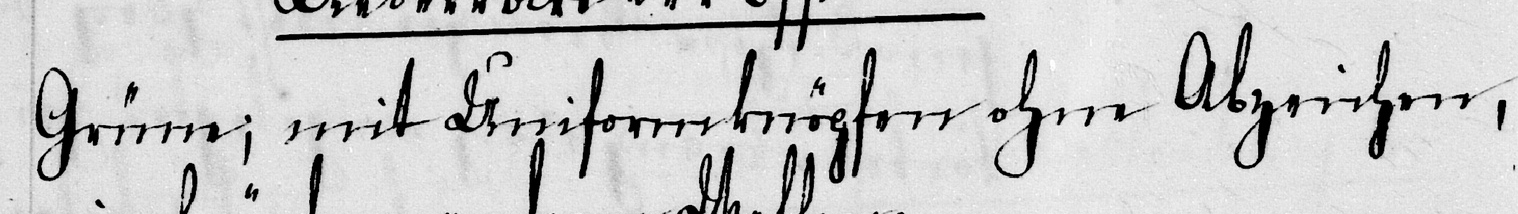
Grüne; mit Uniformknöpfen ohne Abzeichen,
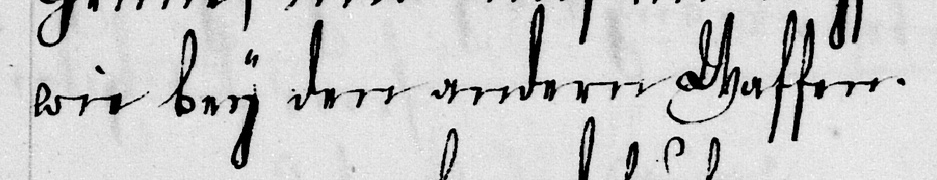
wie bey den andern Waffen.
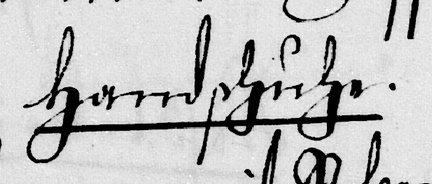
Handschuhe.
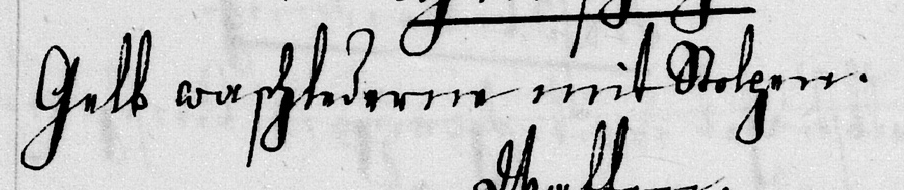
Gelb waschlederne mit Stolpen.
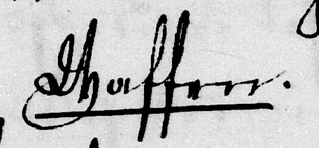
Waffen.
